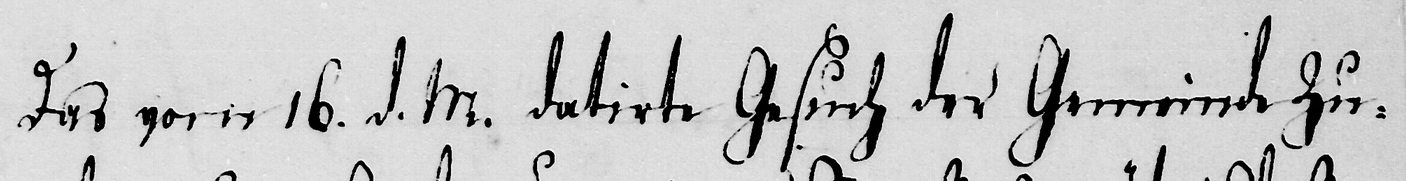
Das vom 16. d. M. datirte Gesuch der Gemeinde Zu¬
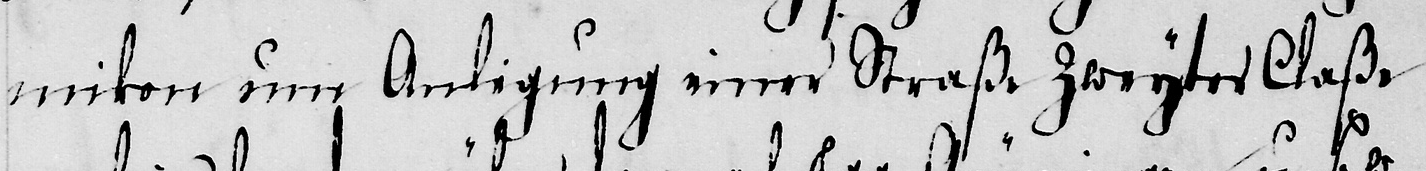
mikon um Anlegung einer Straße zweyter Claße
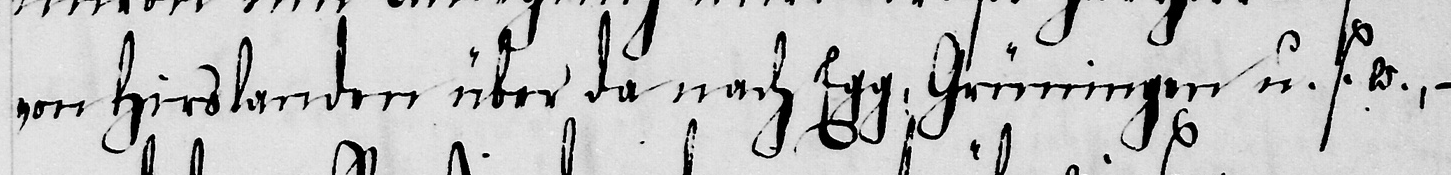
von Hirslanden über da nach Egg, Grüningen u.s.w.,
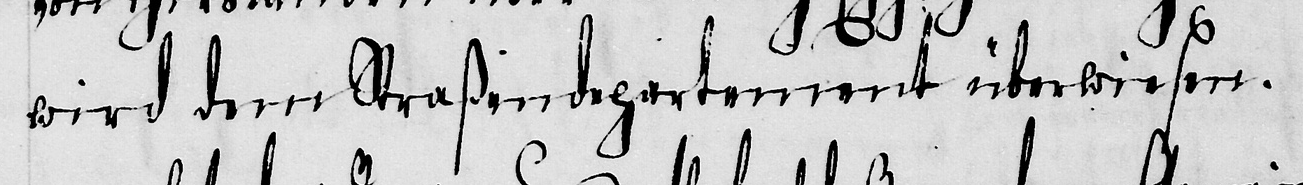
wird dem Straßendepartement überwiesen.
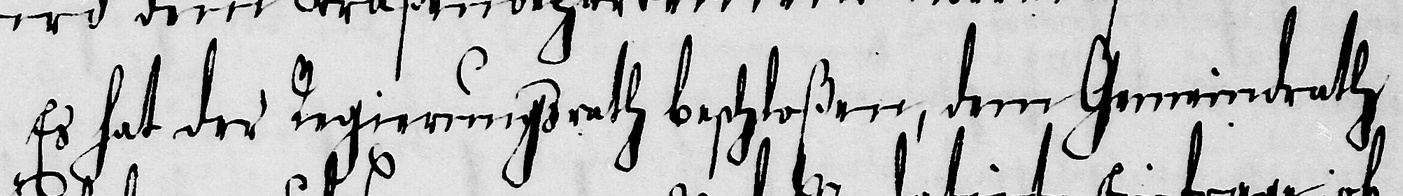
Es hat der Regierungsrath beschloßen, dem Gemeindrath
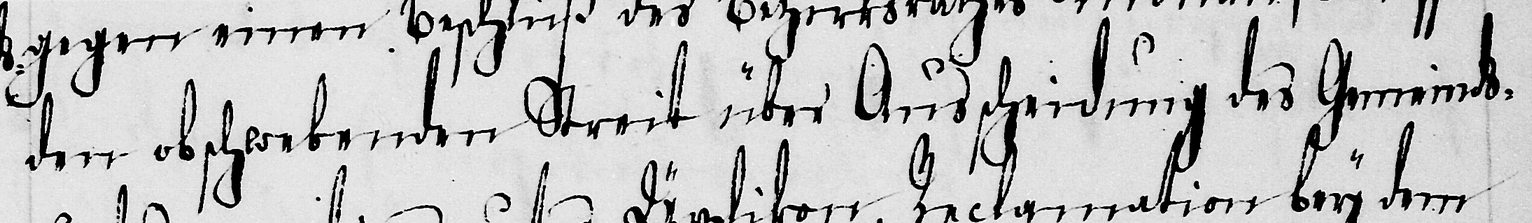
den obschwebenden Streit über Ausscheidung des Gemeinds-
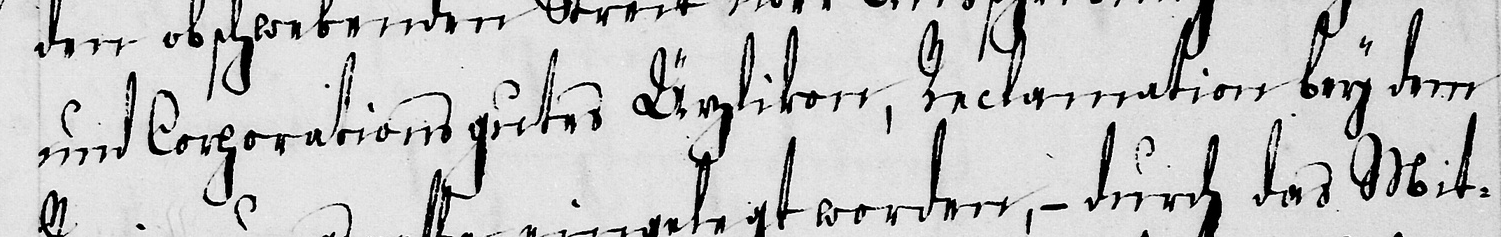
und Corporationsgutes Ürzlikon, Reclamation bey dem
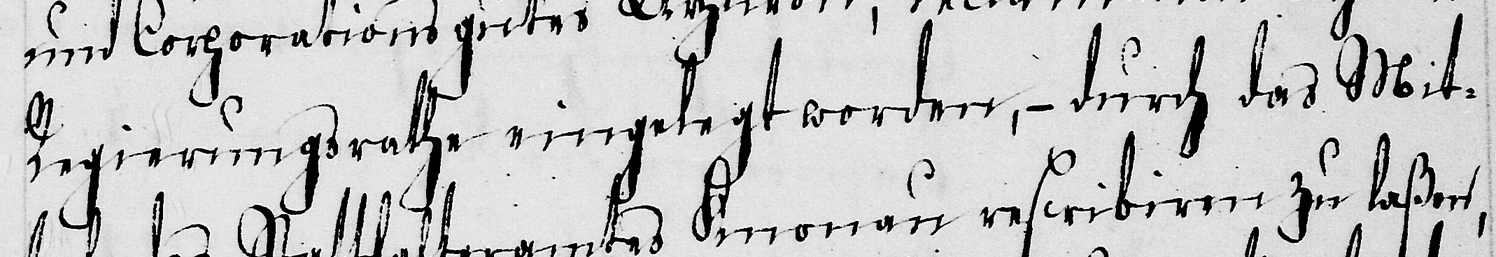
Regierungsrathe eingelegt worden, – durch das Mit¬
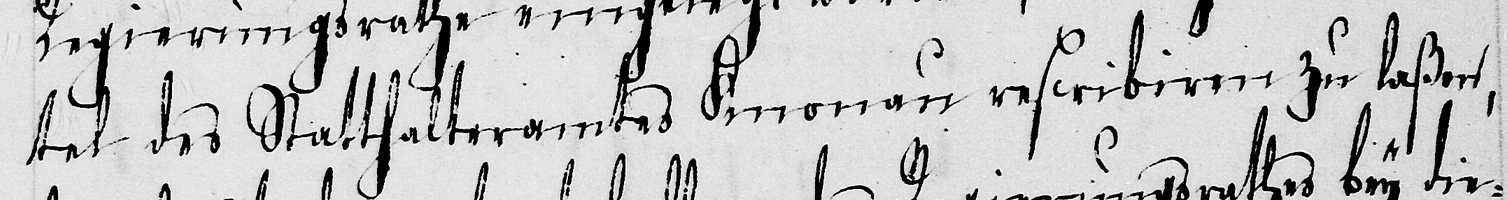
tel des Statthalteramtes Knonau rescribiren zu laßen,
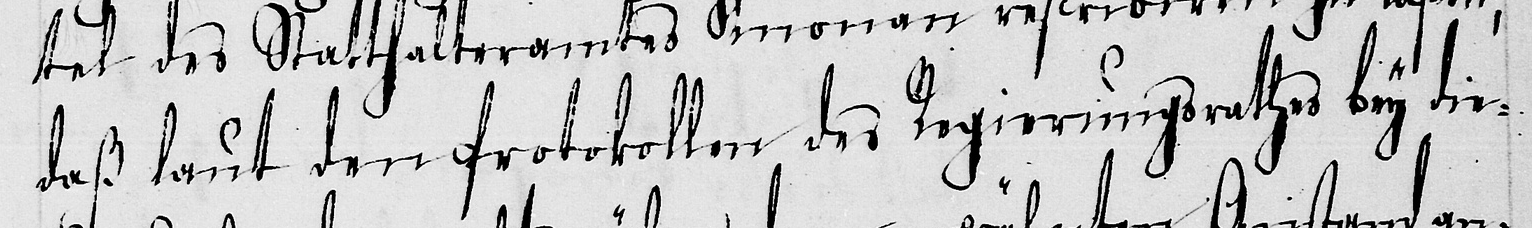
daß laut den Protokollen des Regierungsrathes bey die¬
